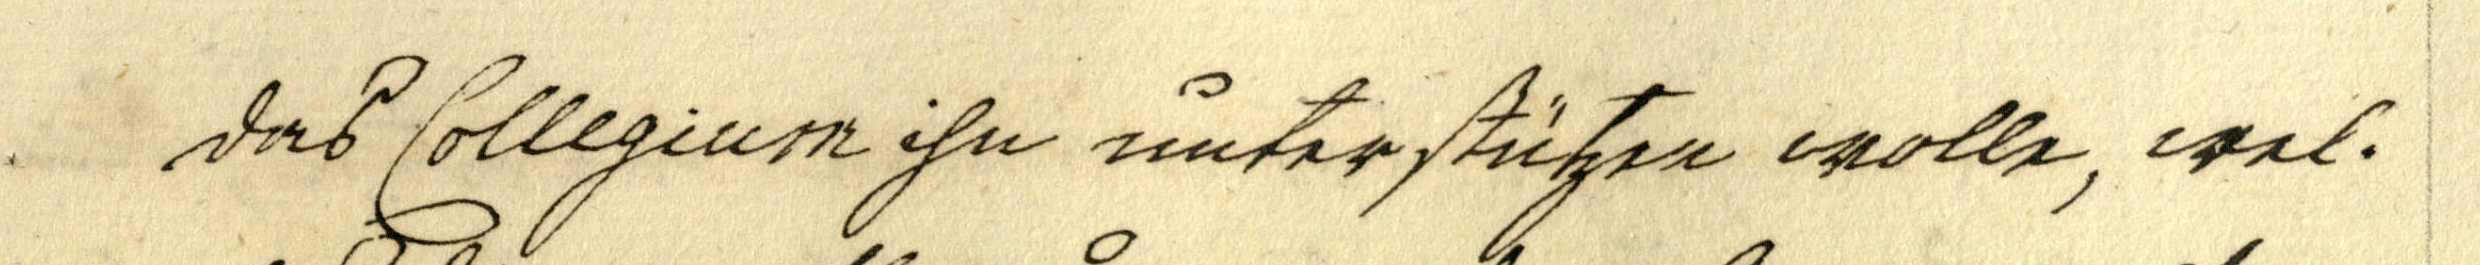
das Collegium ihn unterstützen wolle , wes
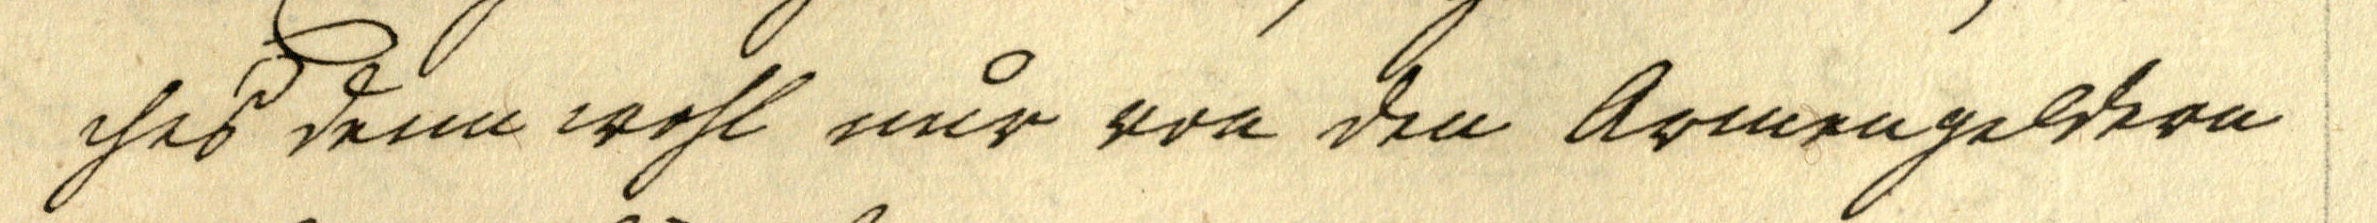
ches denn wohl nur von den Armen gelesen
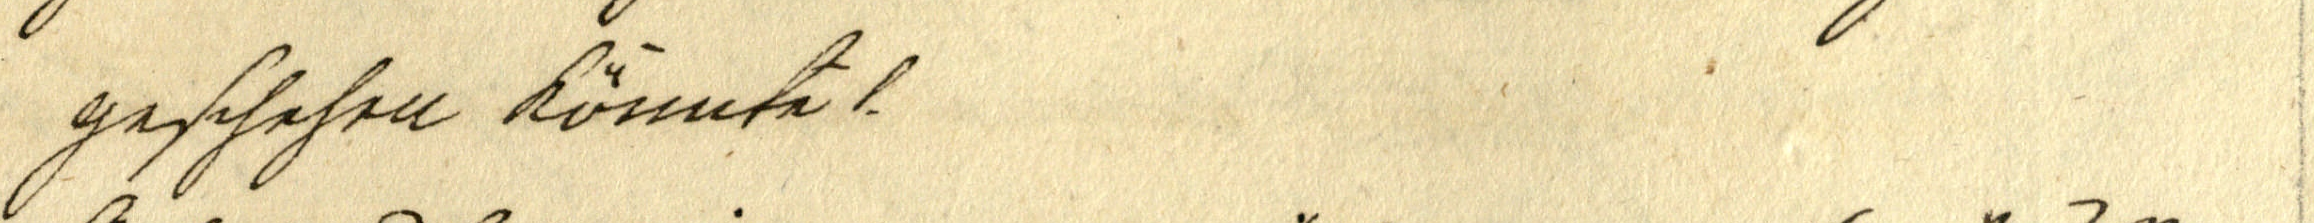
geschehen könnte
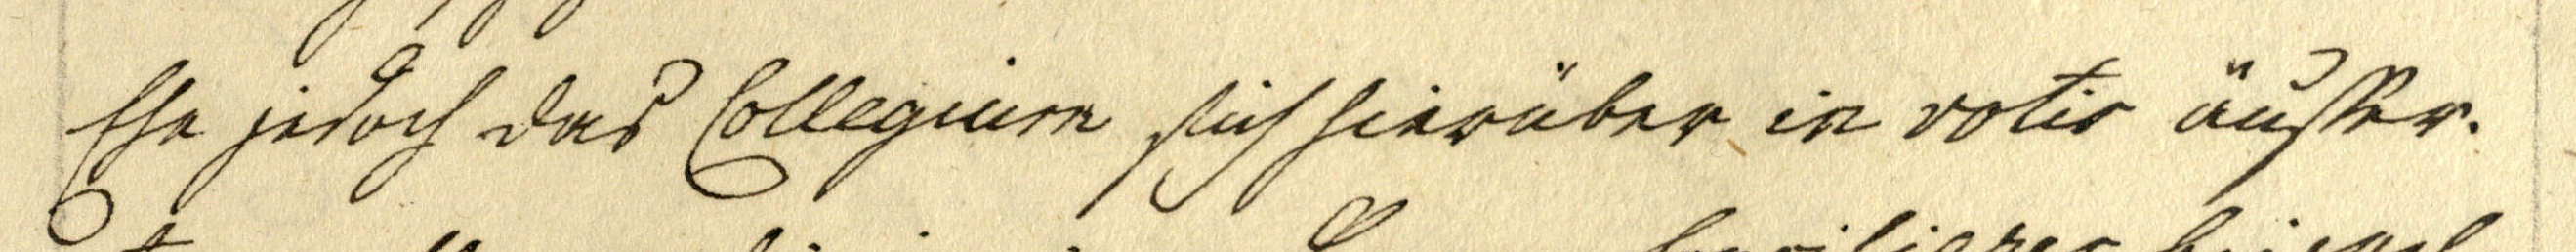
Ehe jedoch das Collegium sich hierüber in voto äusser
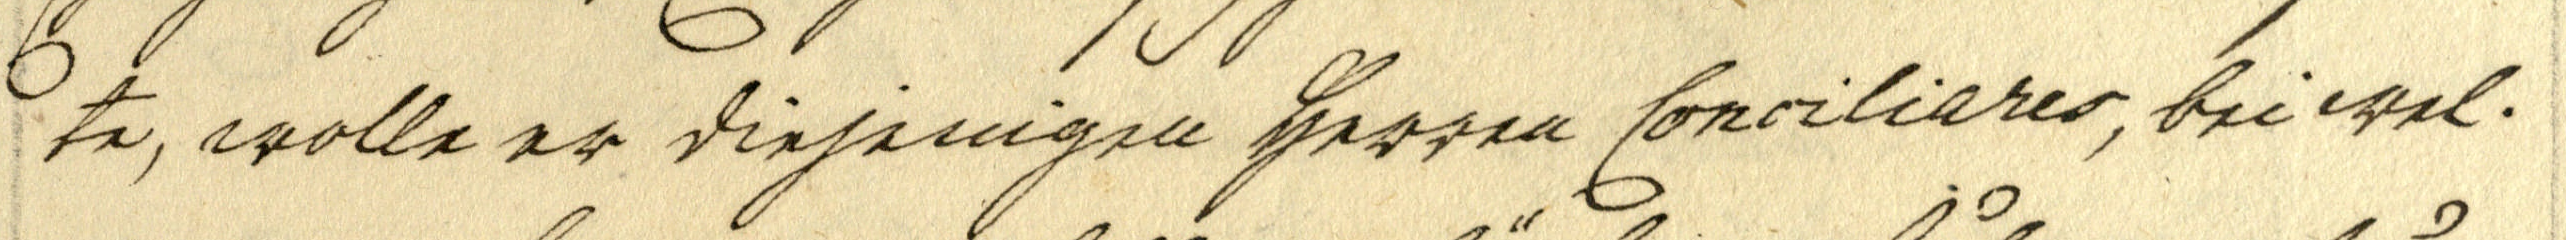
te , wolle er diejenigen Herren Conciliares bei wel
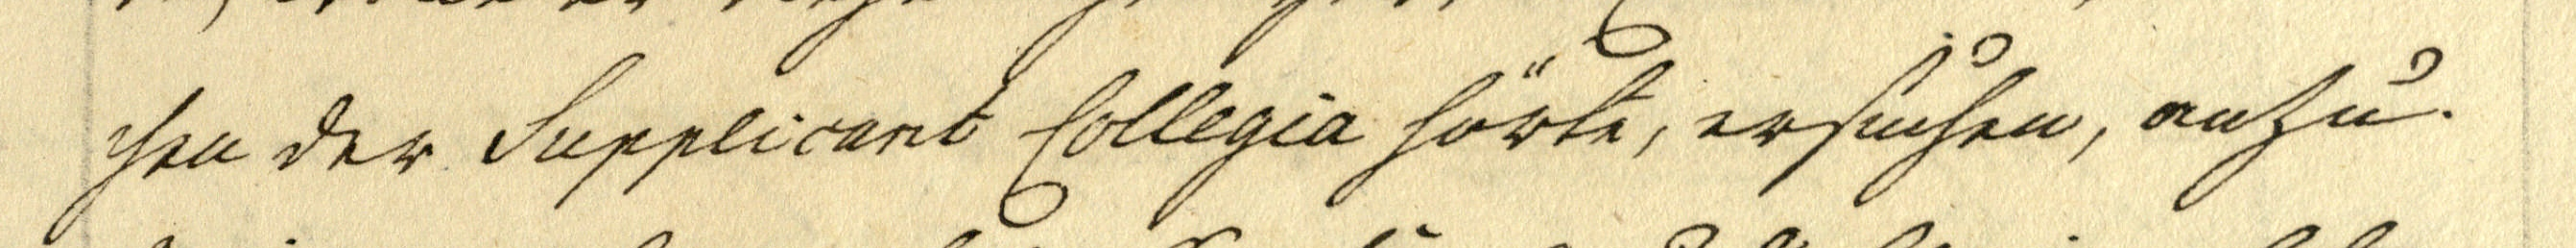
chen der Supplicant Collegia hat , ersuchen , wozu
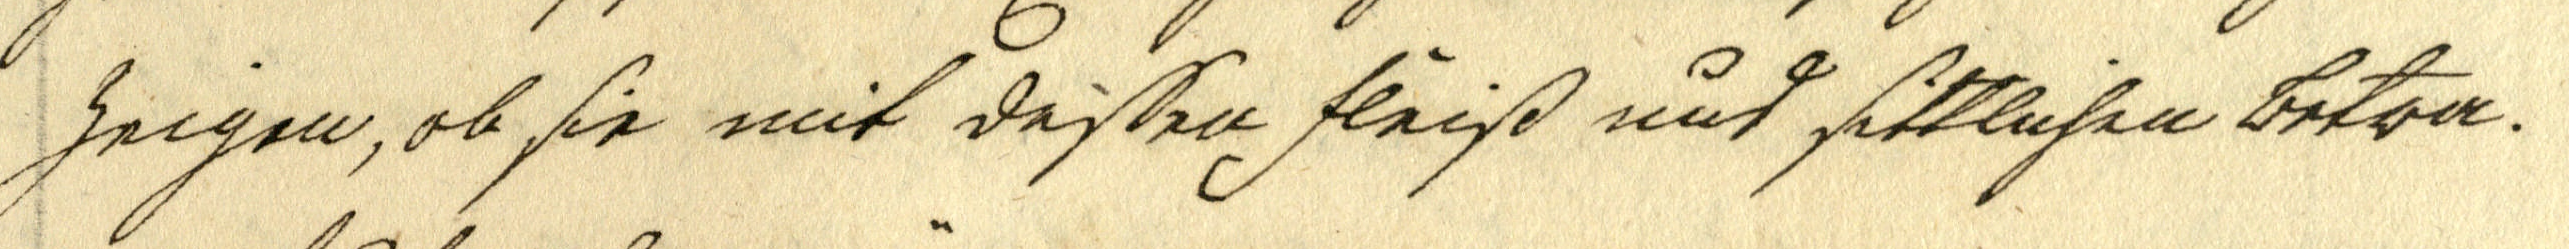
zeigen , ob sie mit dessen Fleiß und sittlichen Betra
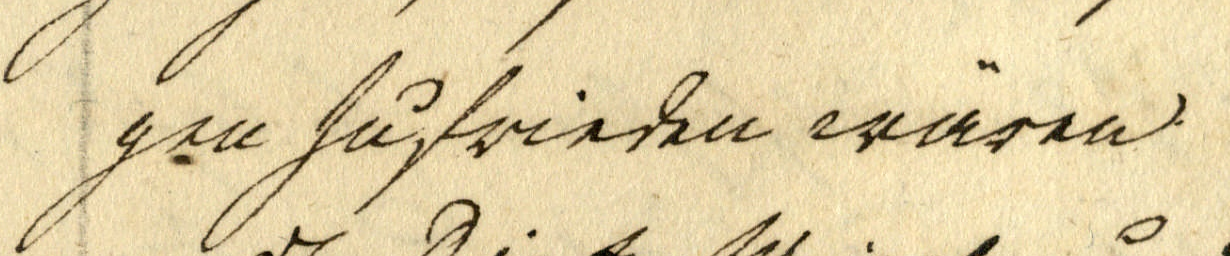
gen zufrieden wären
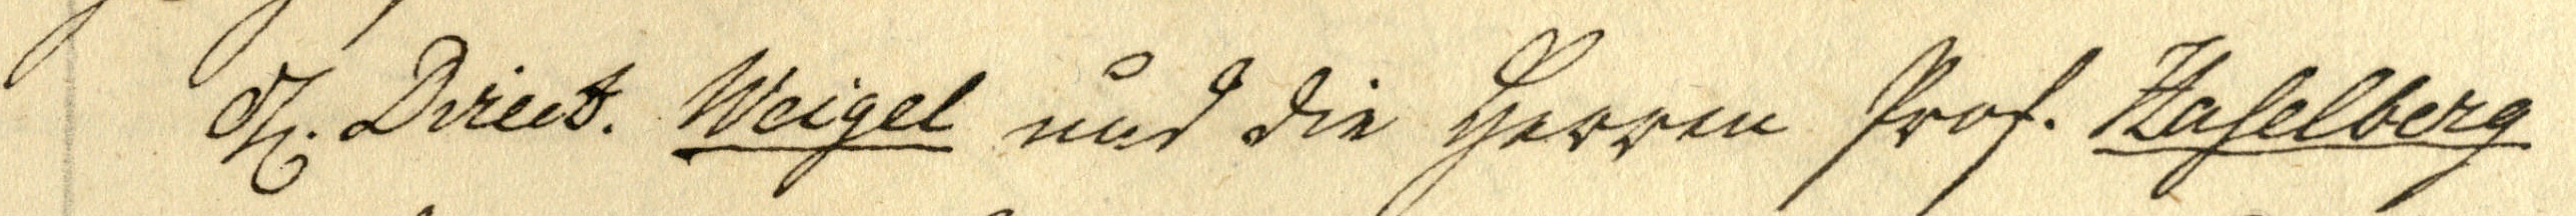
dh . Direct . Weigel und die Herren Prof . Haselberg
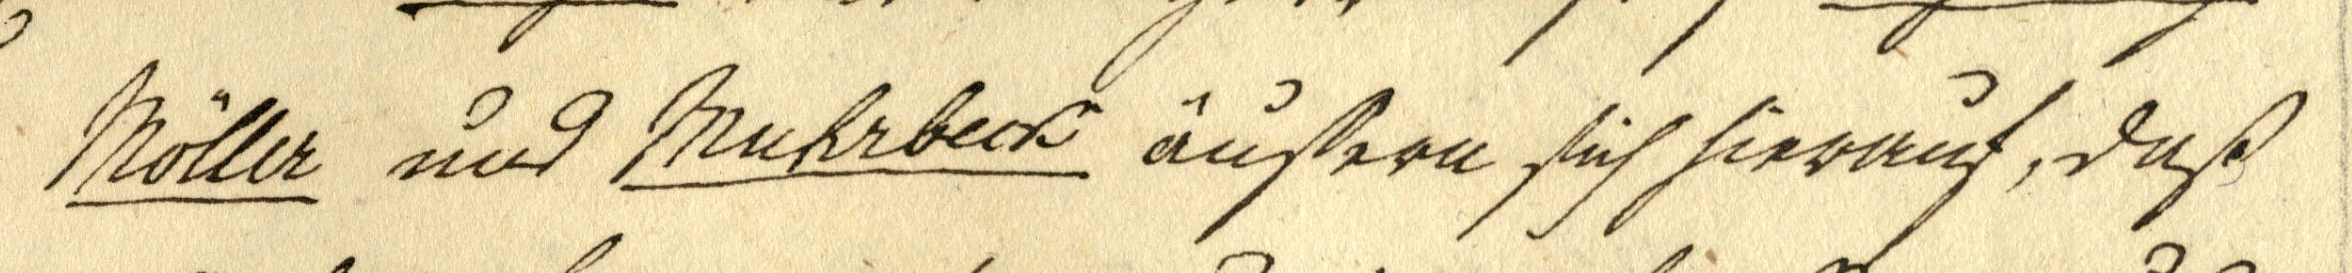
Möller und Gechick äussern sich hierauf das
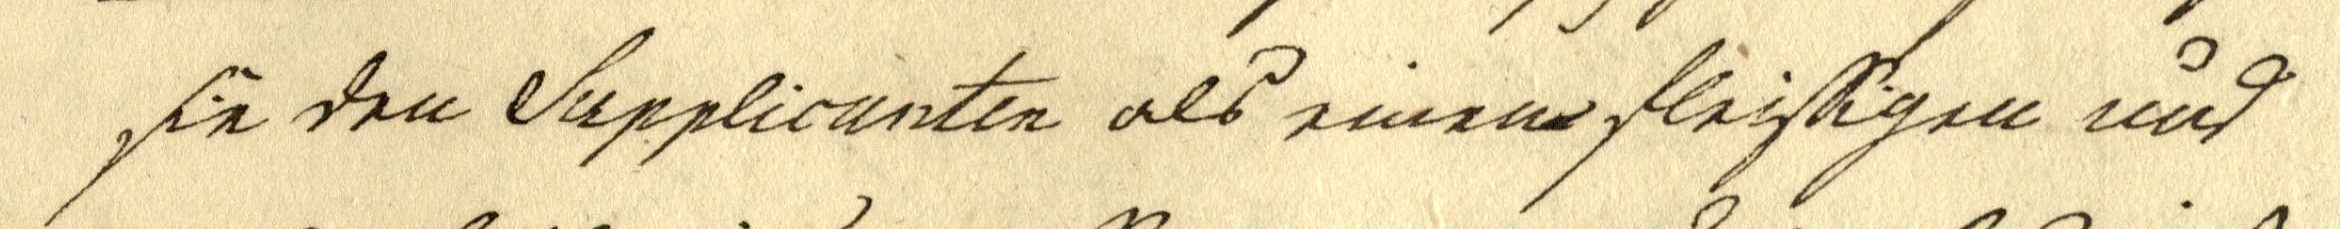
sie den Supplicanten als einen fleissigen und
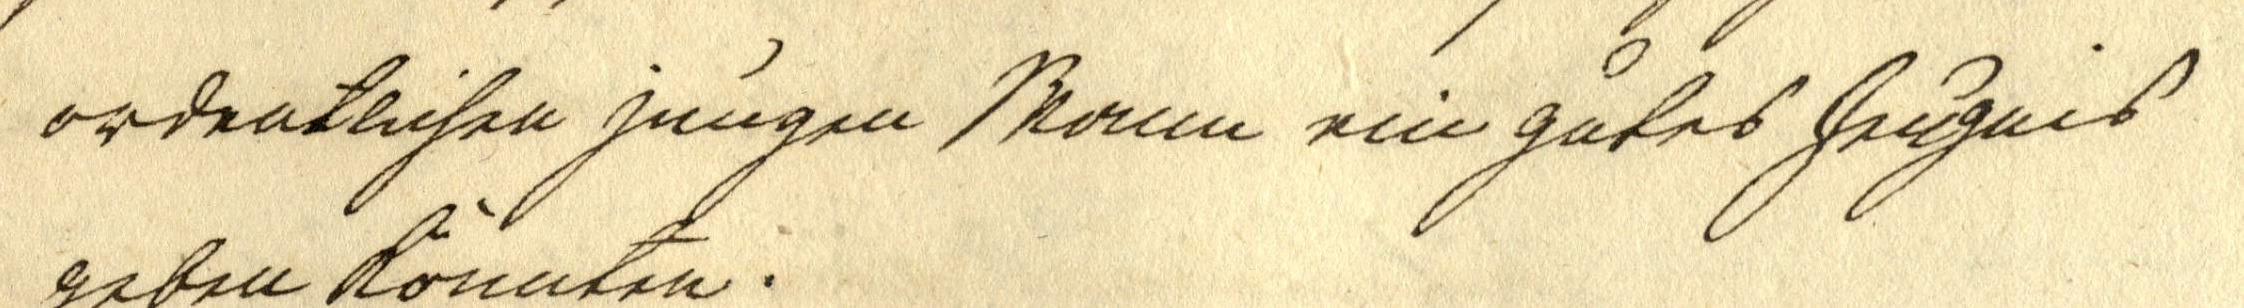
ordentlichen jungen Mann ein halbes Zeugnis
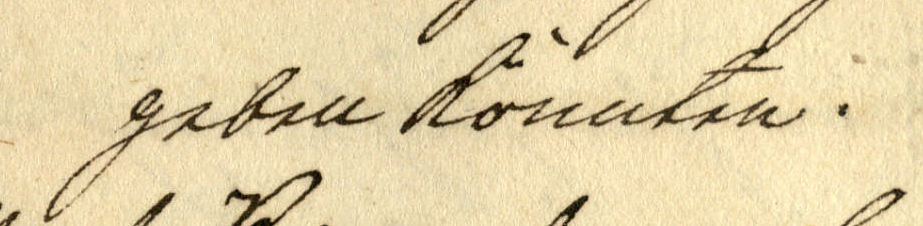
geben koennten .
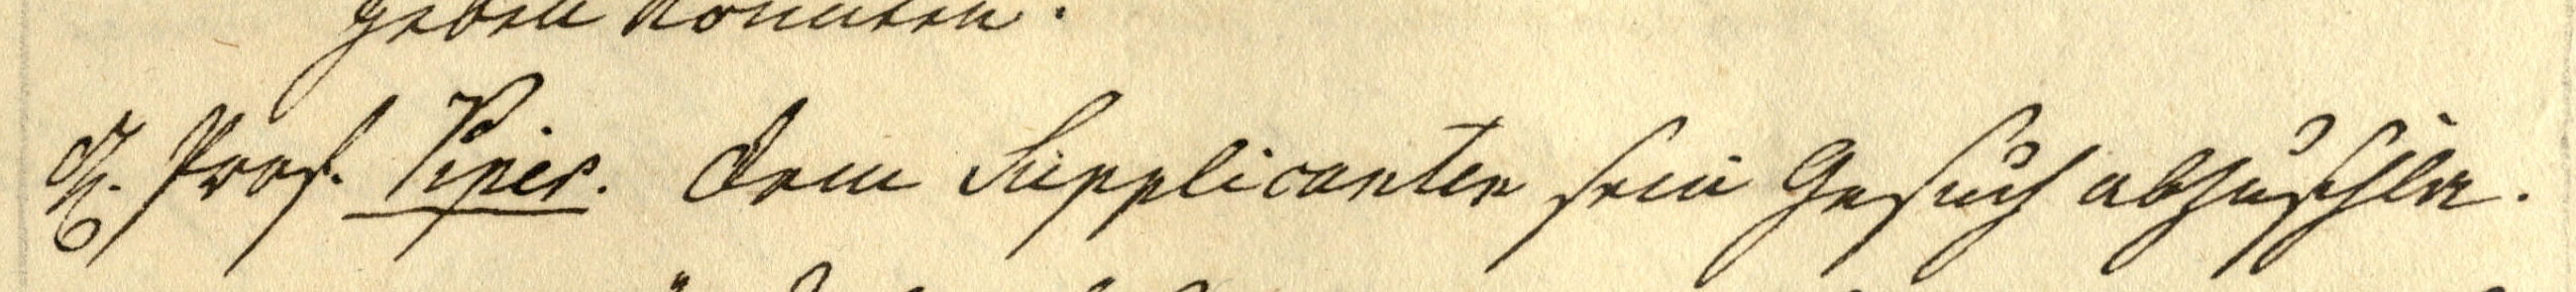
dh Prof schul Den Supplicanten sein Gesuch abzustellen
